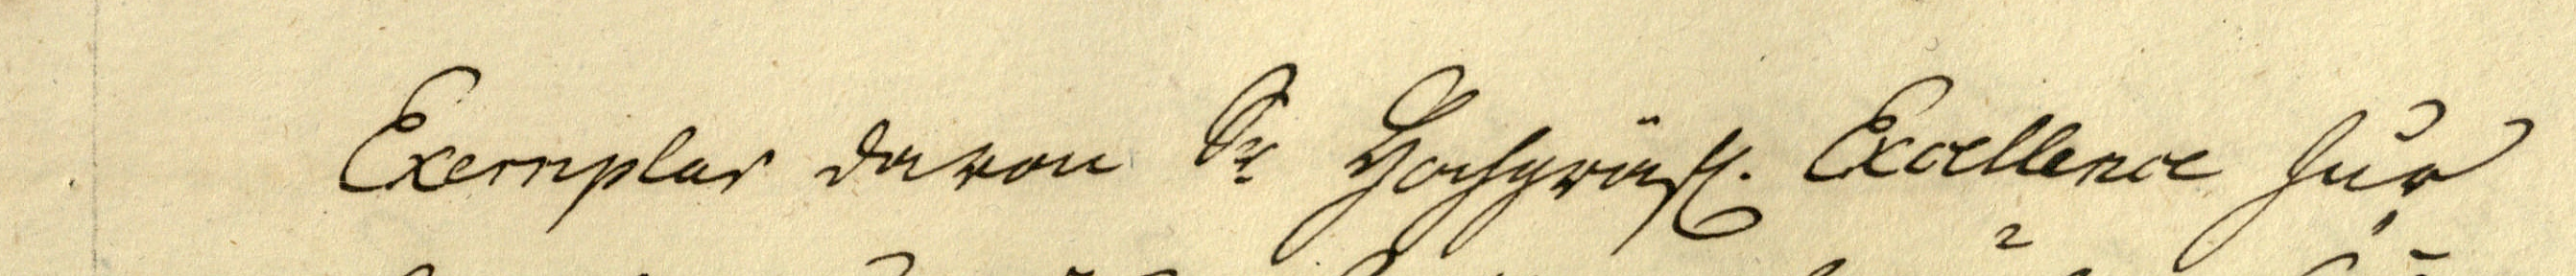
Exemplar davon Sr. Hochgräfl. Excellence zur
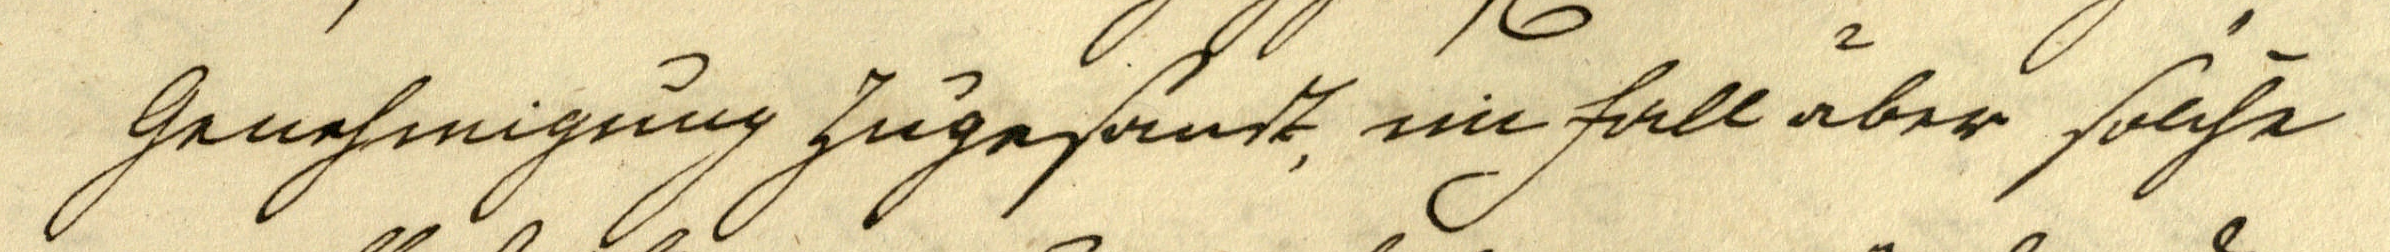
Genehmigung zugesandt, im Fall aber, solche
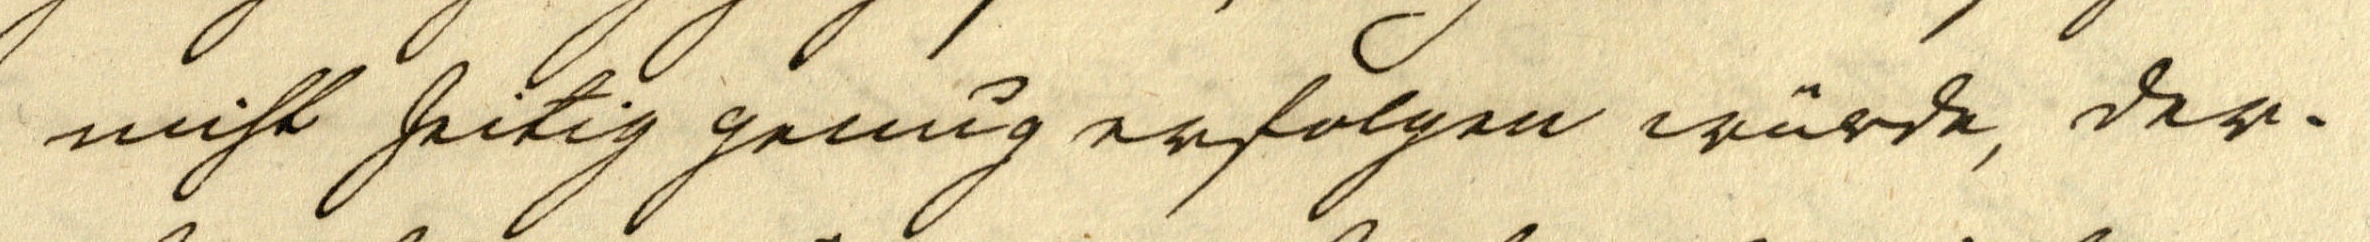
nicht zeitig genug erfolgen würde, der-
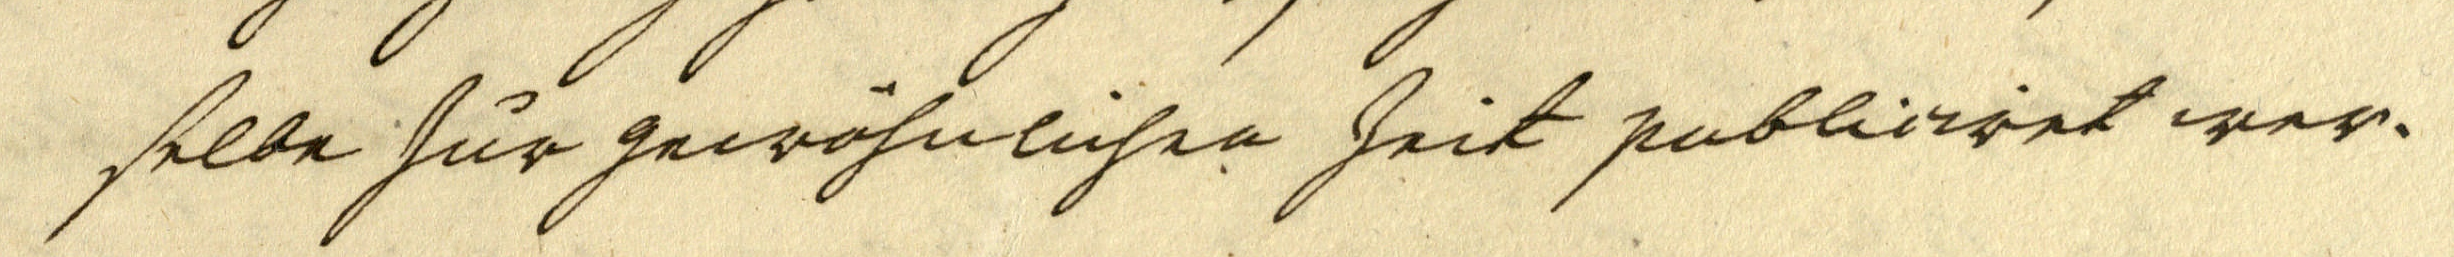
selbe zur gewöhnlichen Zeit publiciret wer-
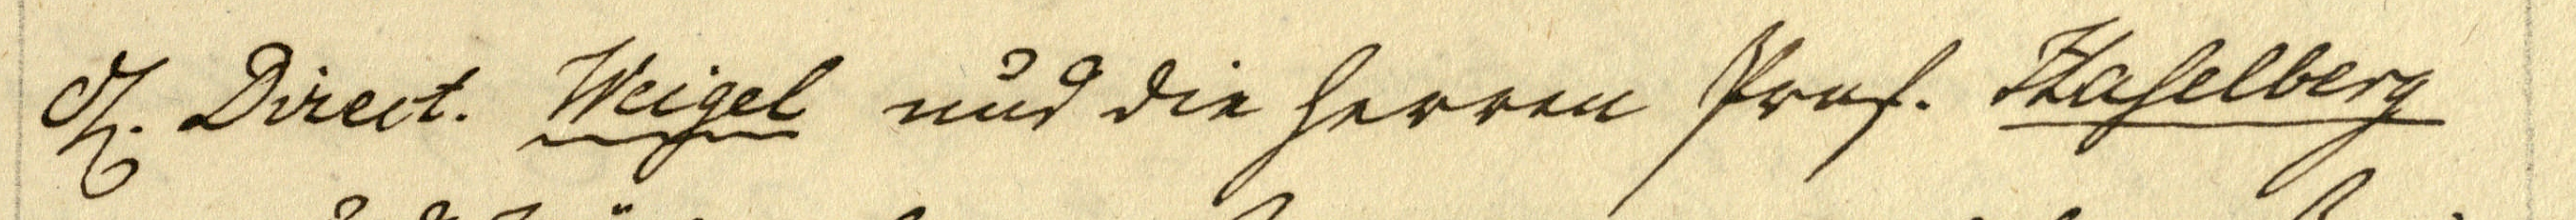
dh. Direct. Weigel und die herren Prof. Haselberg
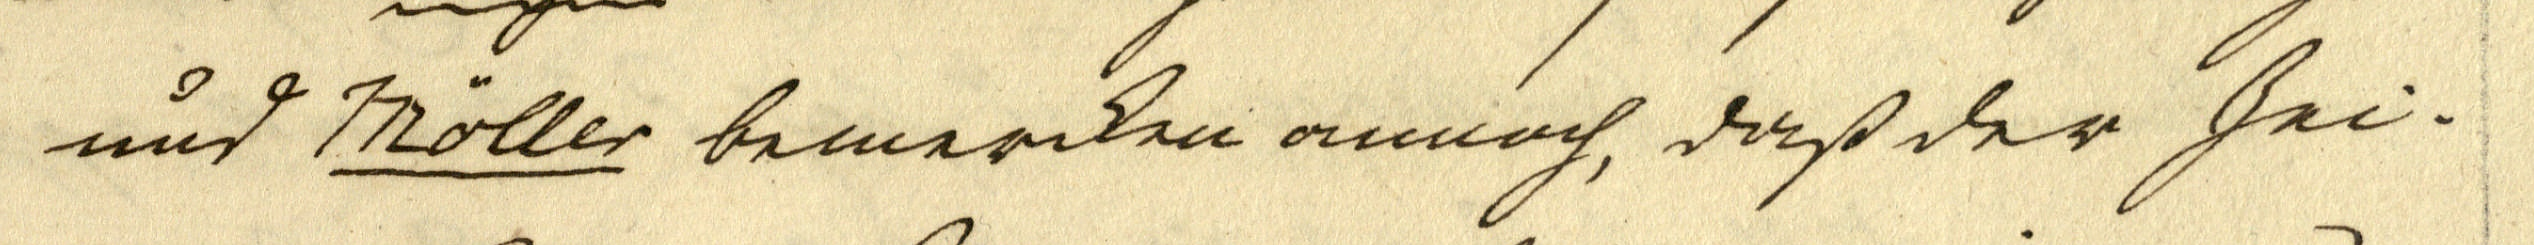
und Möller bemerken annoch, daß der Zei-
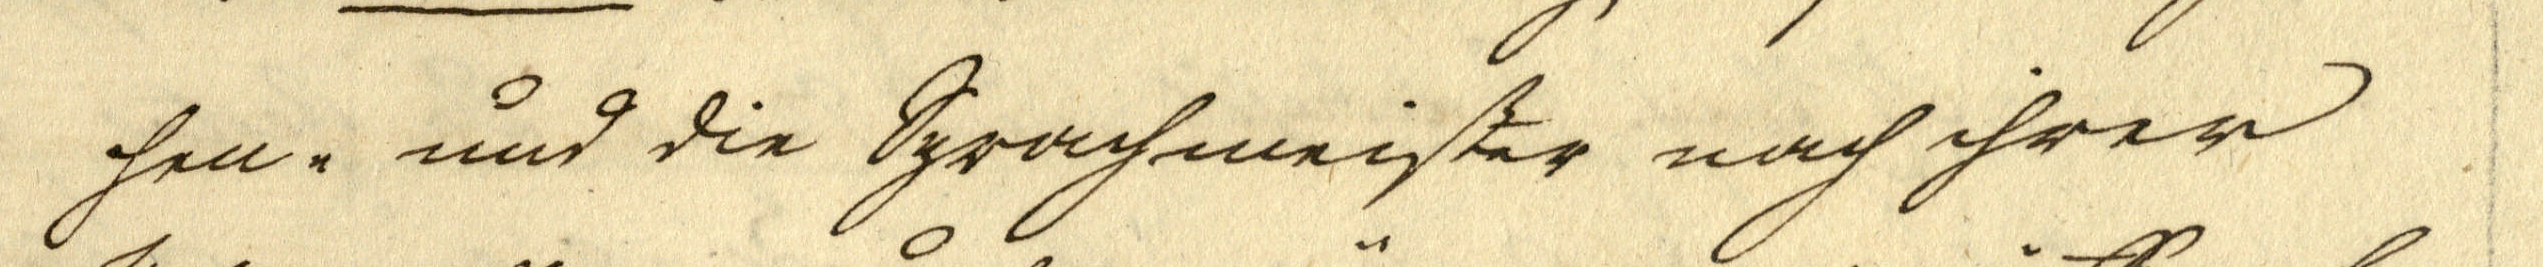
chen- un ddie Sprachmeister nach ihrer
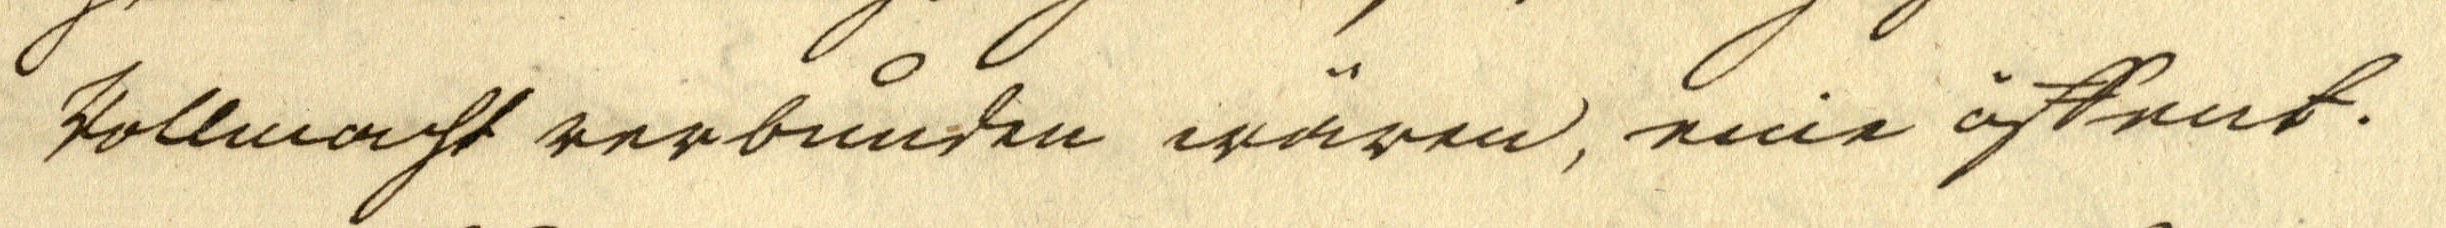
Vollmacht verbunden wären, eine öffent-
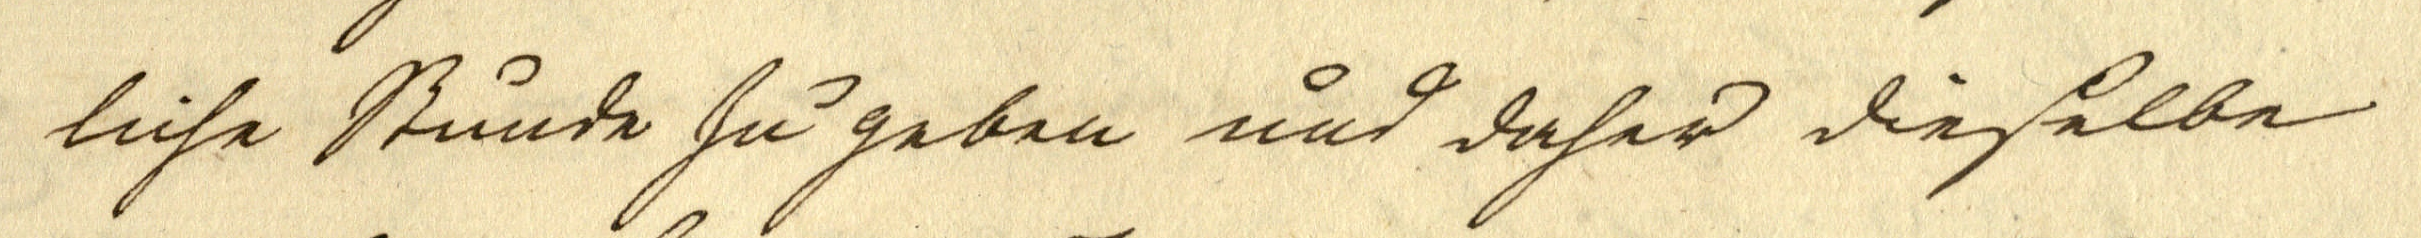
liche Stunde zu geben und daher dieselbe
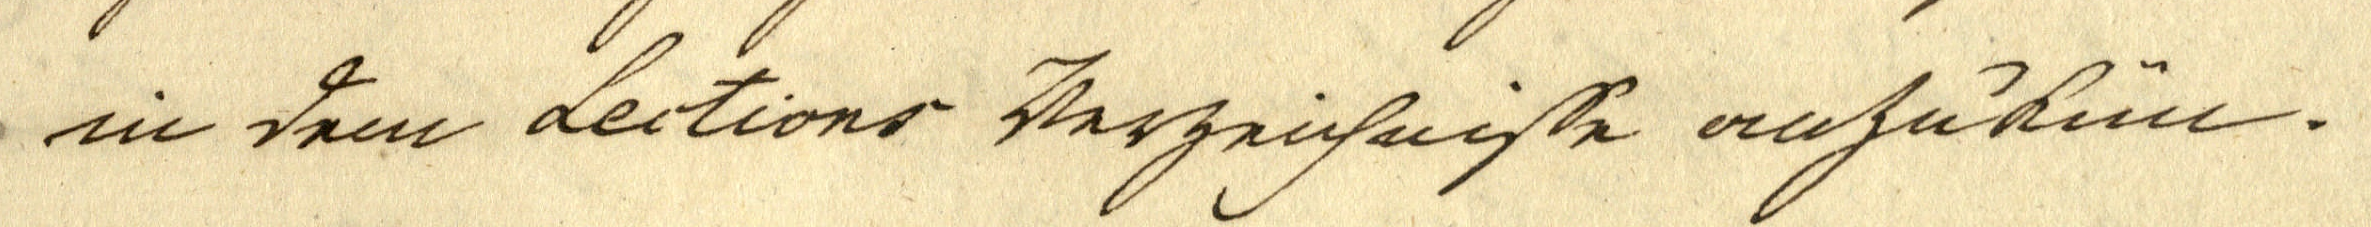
in dem Lecitons Verzeichnisse anzukün-
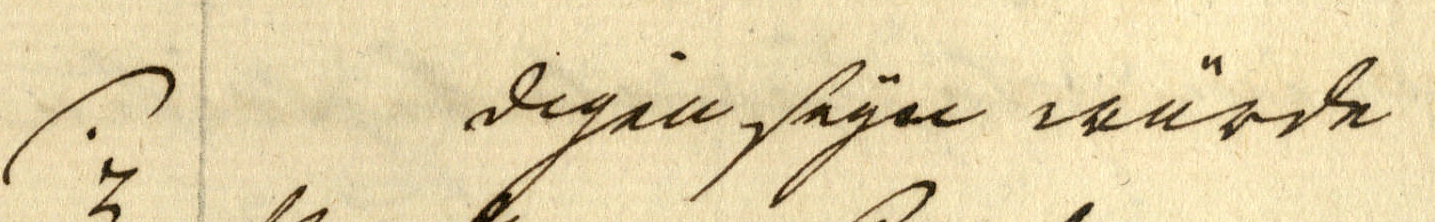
digen seyn würde.
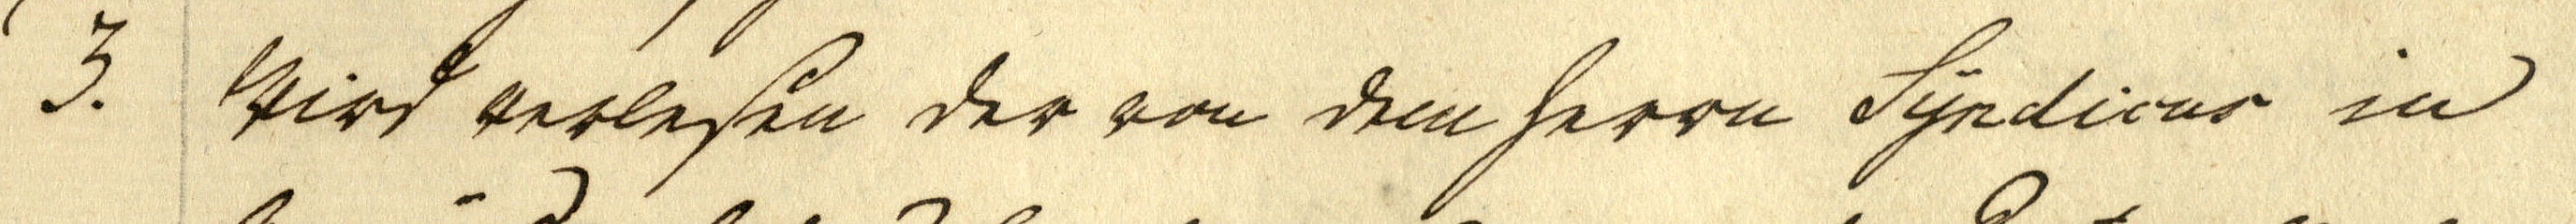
3. Wird verlesen der von dem herrn Syndicus in
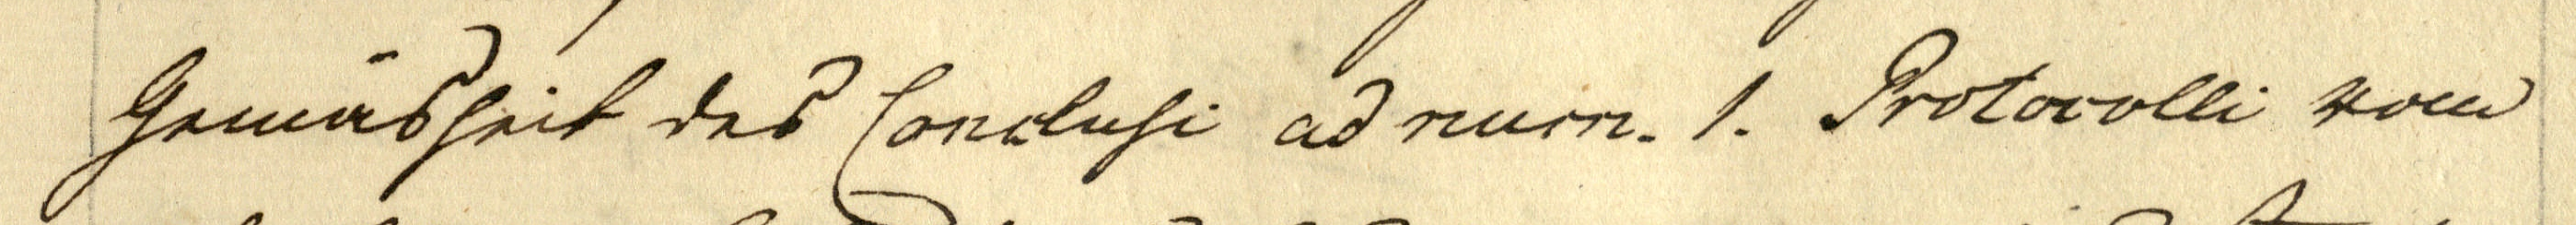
Gemäsheit des Conclusi ad num. 1. Protocolli vom
